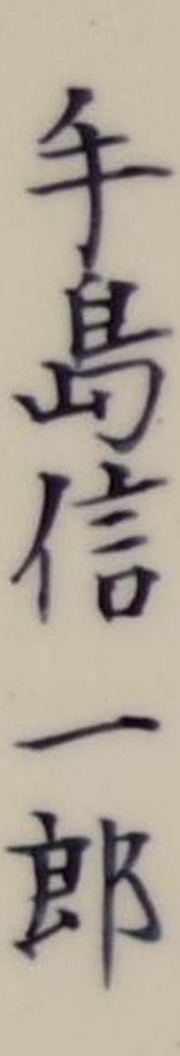手島信一郎

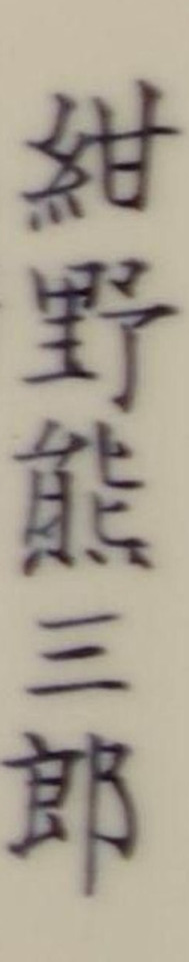紺野熊三郎
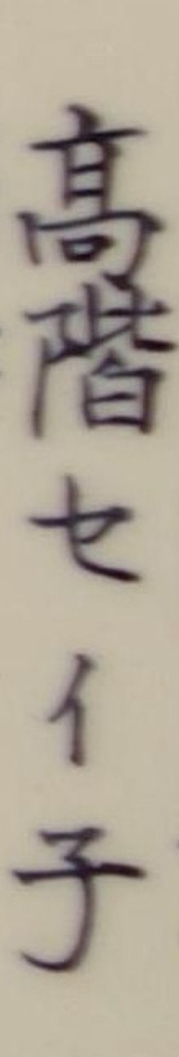高階セイ子
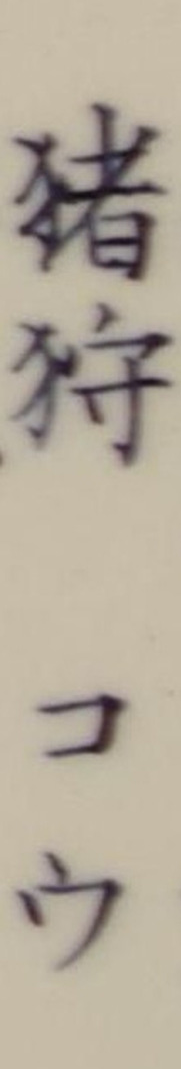猪狩コウ
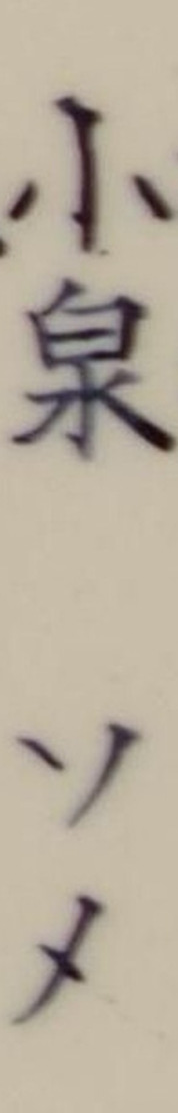小泉ソメ
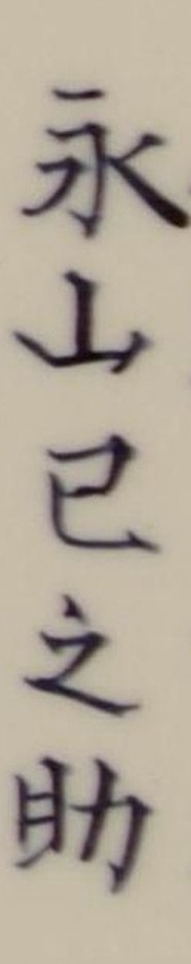永山巳之助
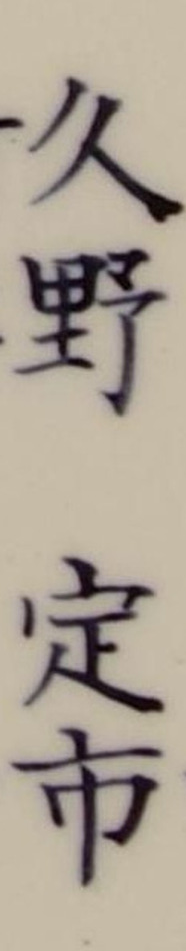久野定市
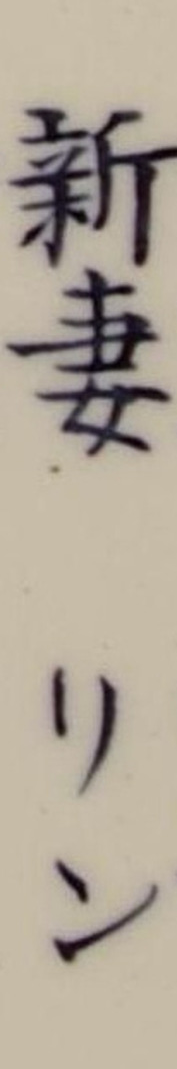新妻リン
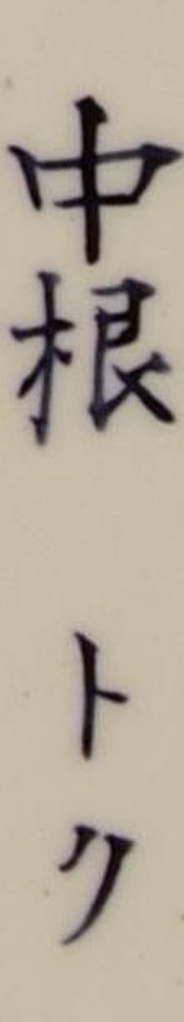中根トク
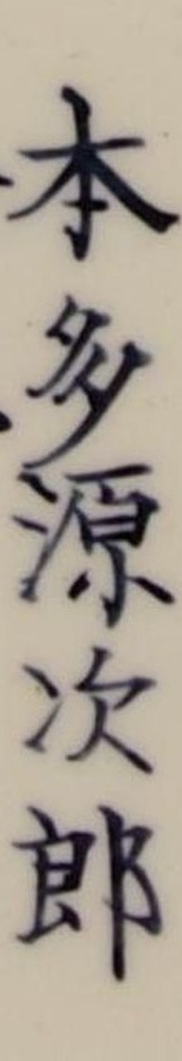本多源次郎
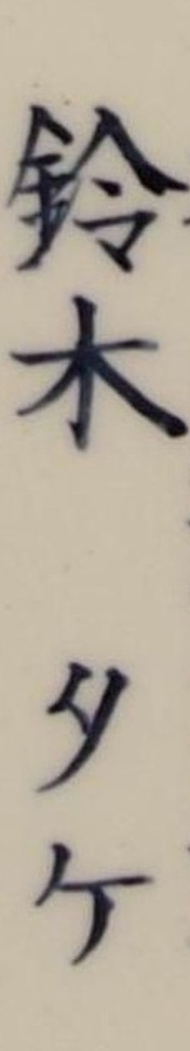鈴木タケ
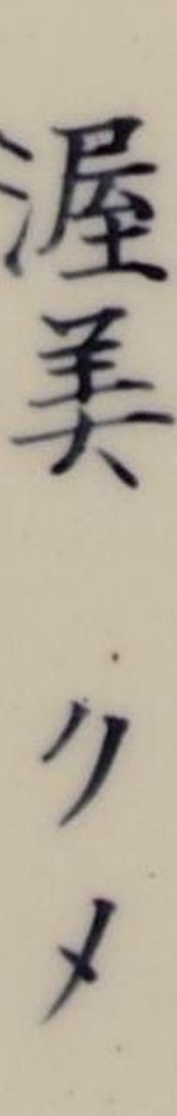渥美クメ
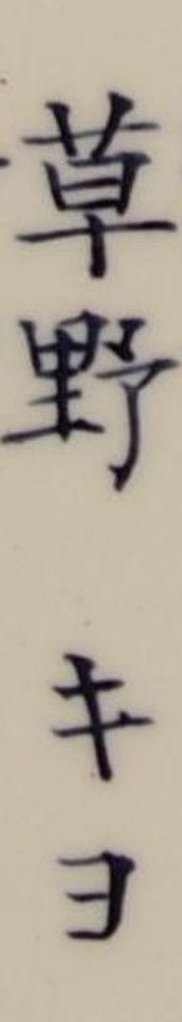草野キヨ
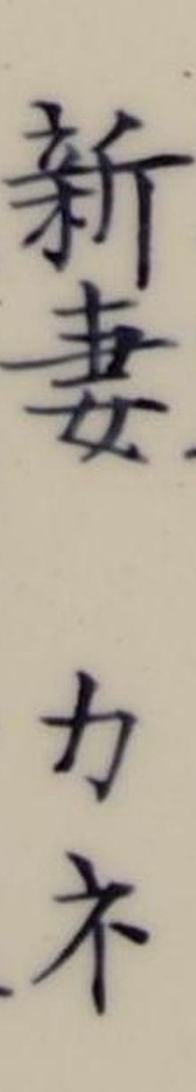新妻カネ
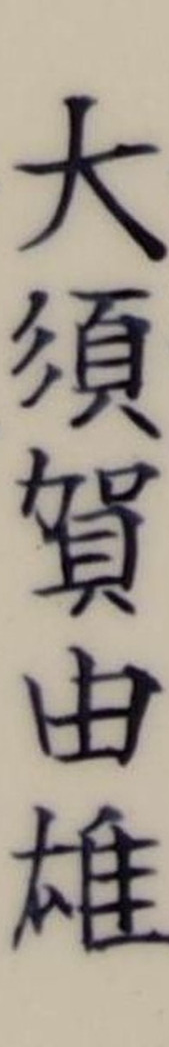大須賀由雄
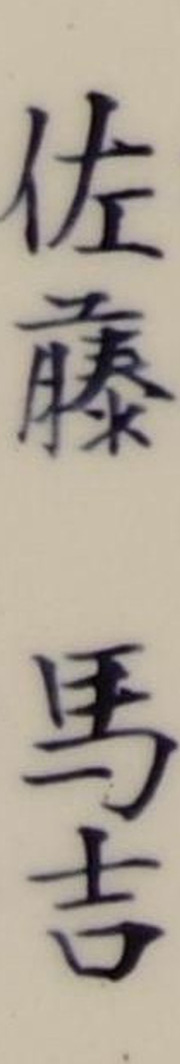佐藤馬吉
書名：E~L
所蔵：高野山金剛峯寺
